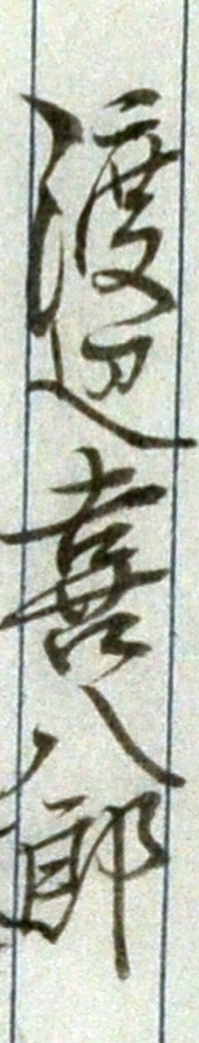渡辺喜八郎
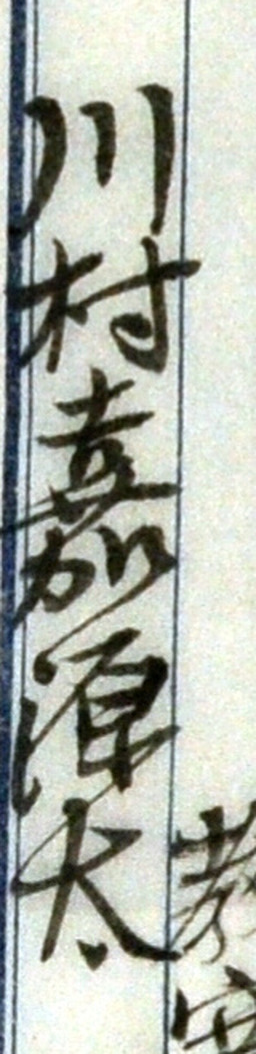川村嘉源太
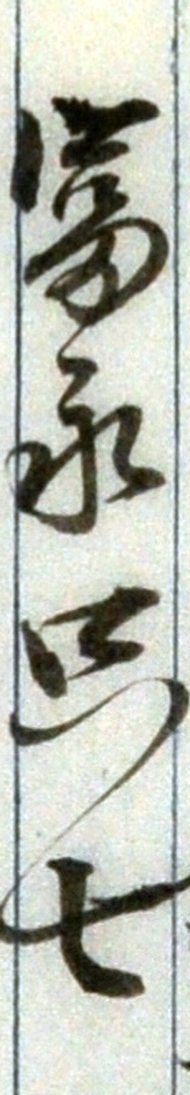富永只七
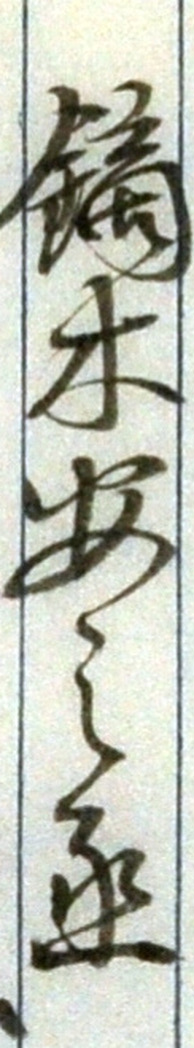鏑木安之丞
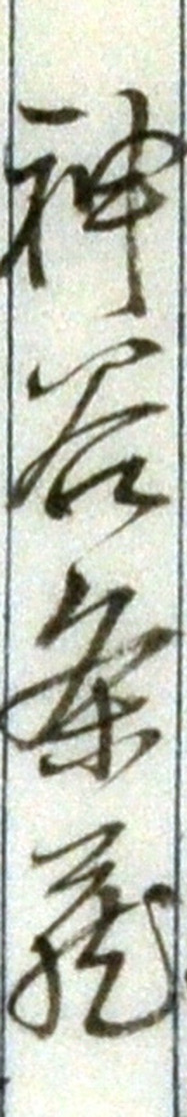神谷条蔵
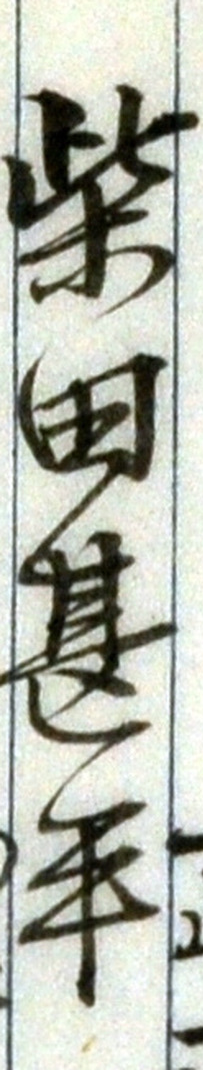柴田甚平
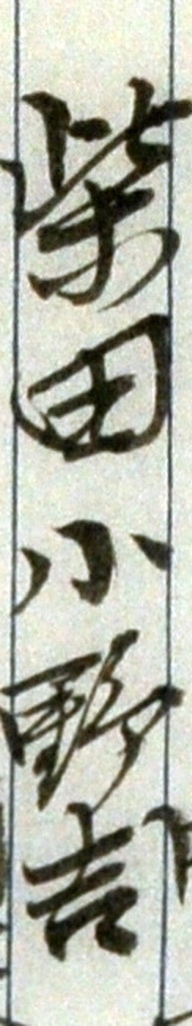柴田小野吉
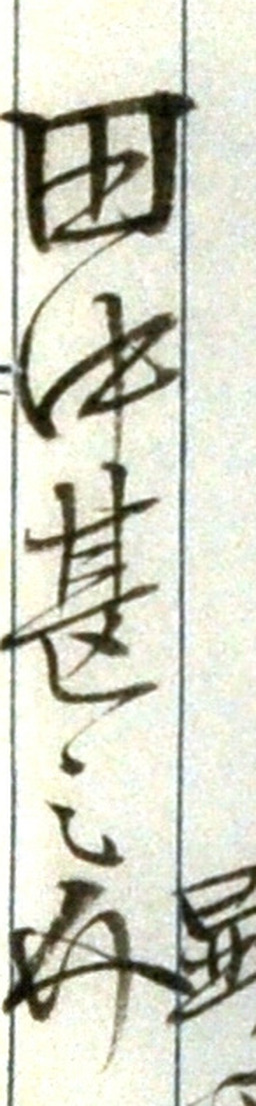田中甚之介

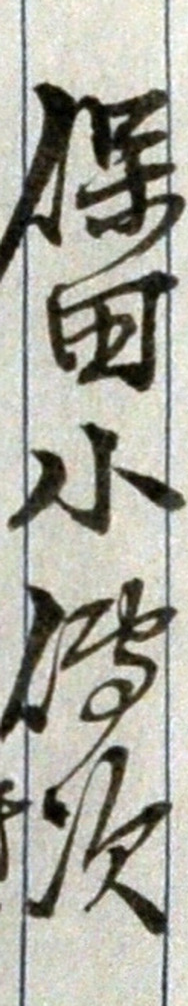保田小伝治
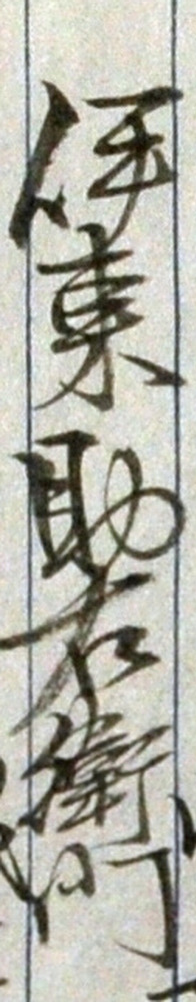伊東助右衛門
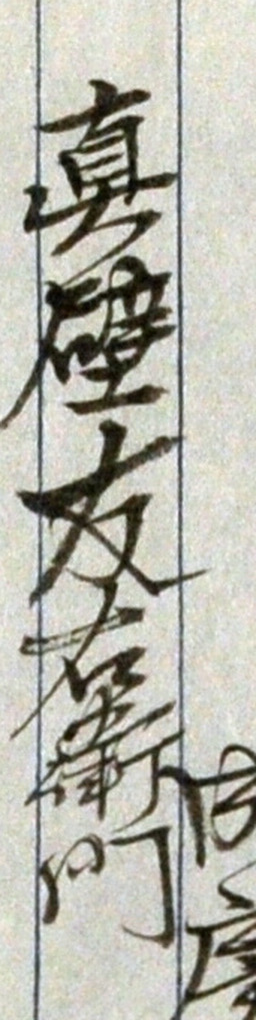真壁友右衛門
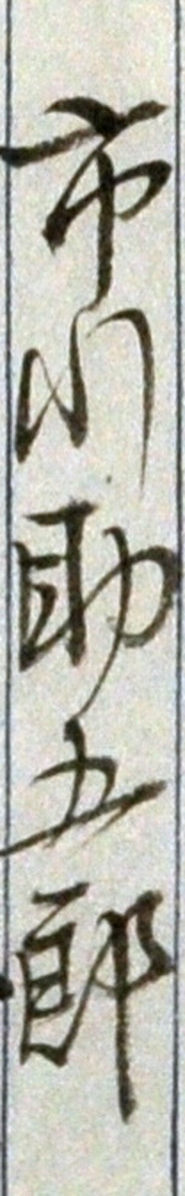市川助五郎
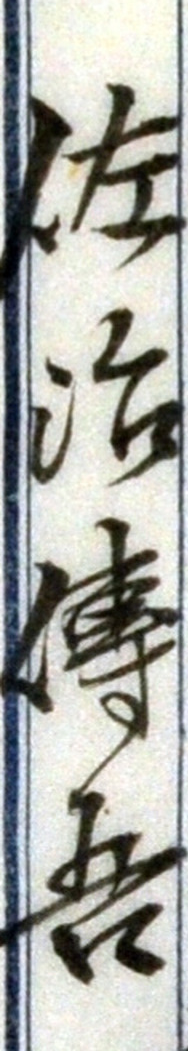佐治伝吾
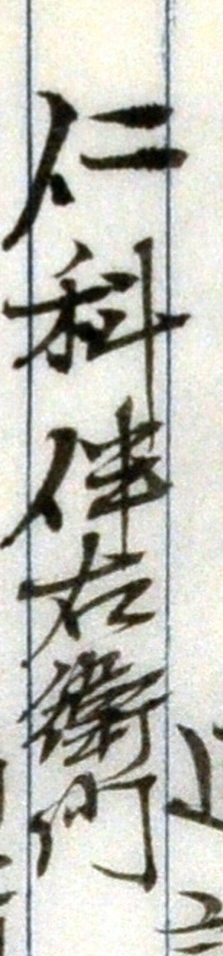仁科伴右衛門
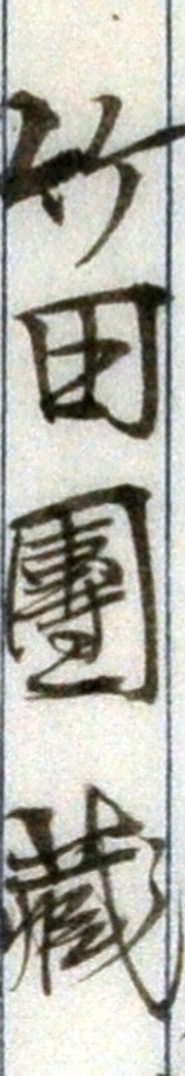竹田団蔵
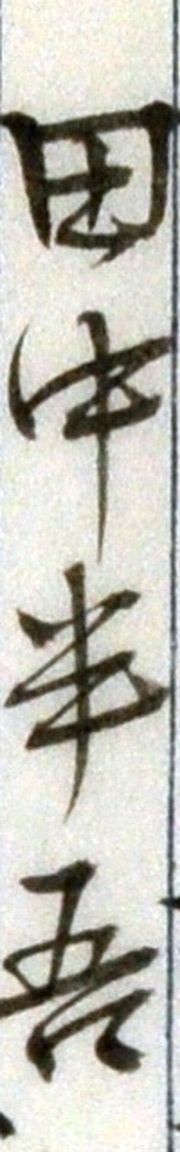田中半吾
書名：竹内流・甲州流・荒木流・一刀流新当流起請文及免許写堤宝山流手鏡及個之大事
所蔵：伊那市立高遠町図書館・合同会社AMANE
